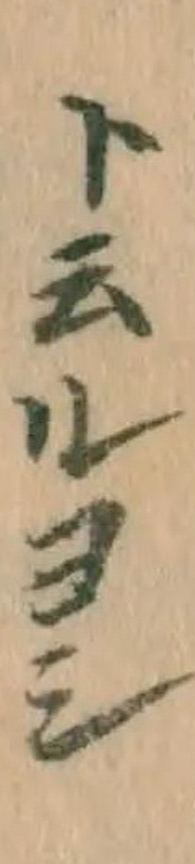ト云ルヨシ
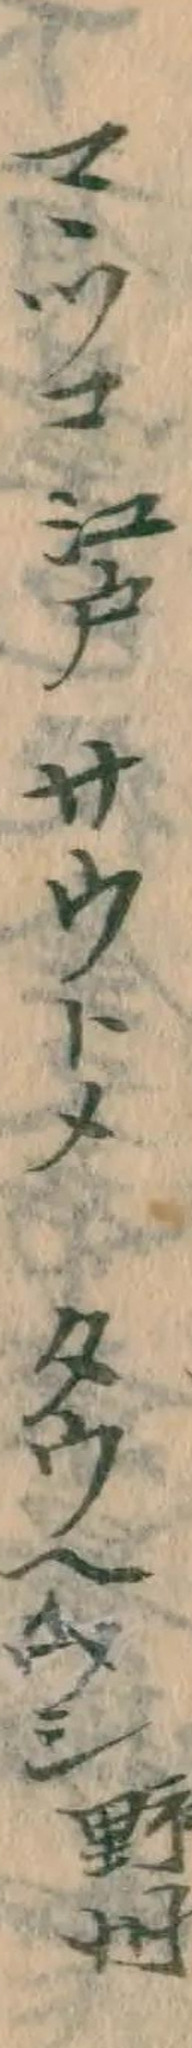マヽツコ江戸サウトメタウヘムシ野州
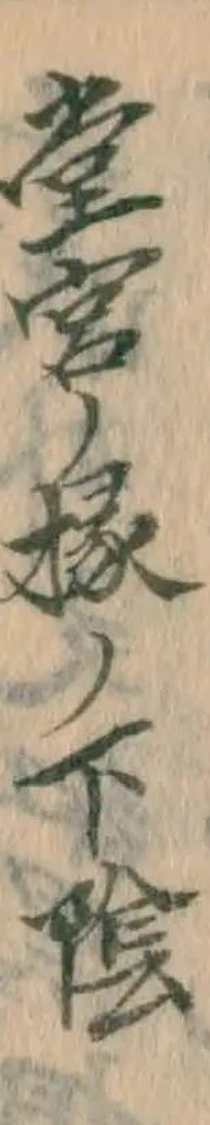堂宮ノ掾ノ下陰
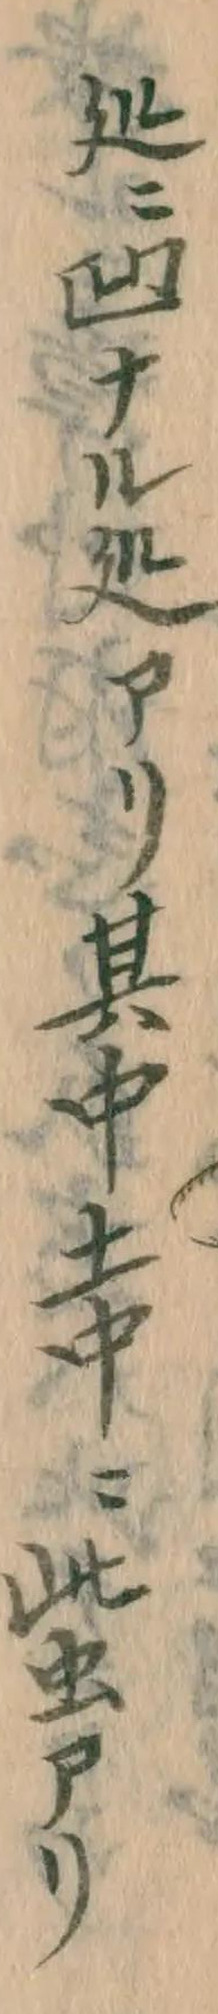処ニ凹ナル処アリ其中土中ニ此虫アリ
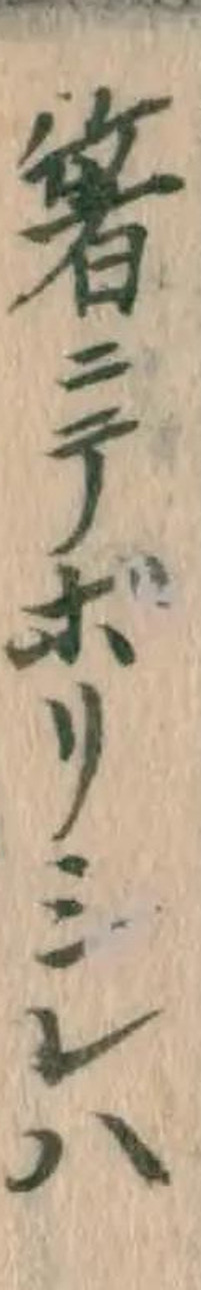箸ニテホリミレハ
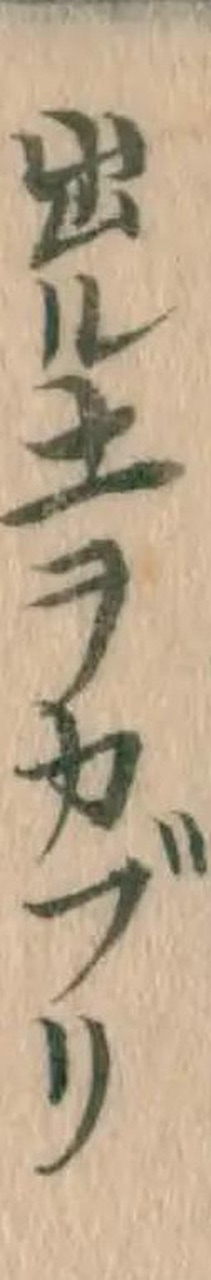出ル土ヲカブリ
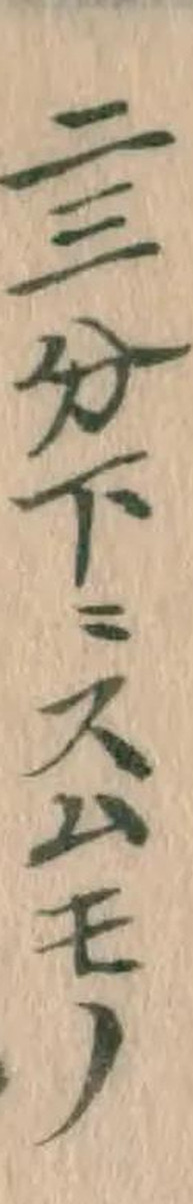二三分下ニスムモノ
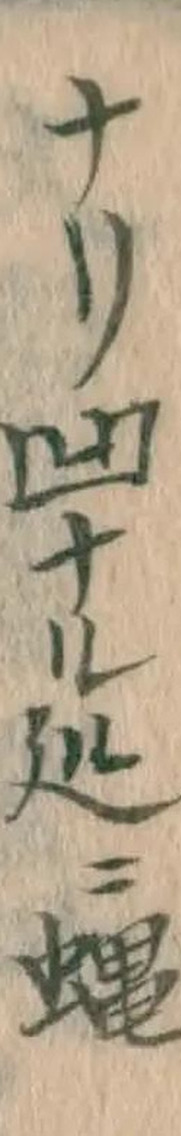ナリ凹ナル処ニ蝿
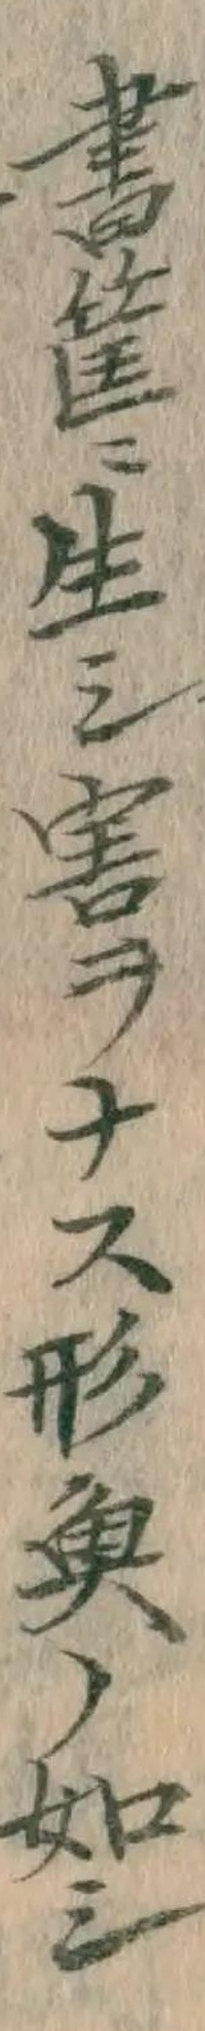書筐ニ生シ害ヲナス形魚ノ如シ
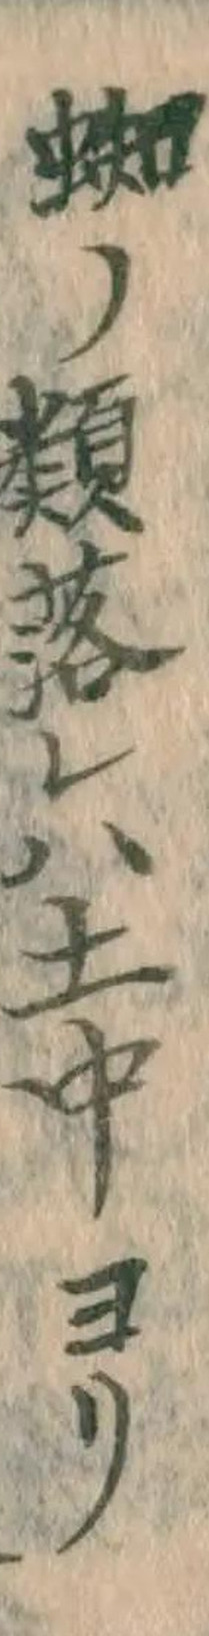蜘ノ類落レハ土中ヨリ
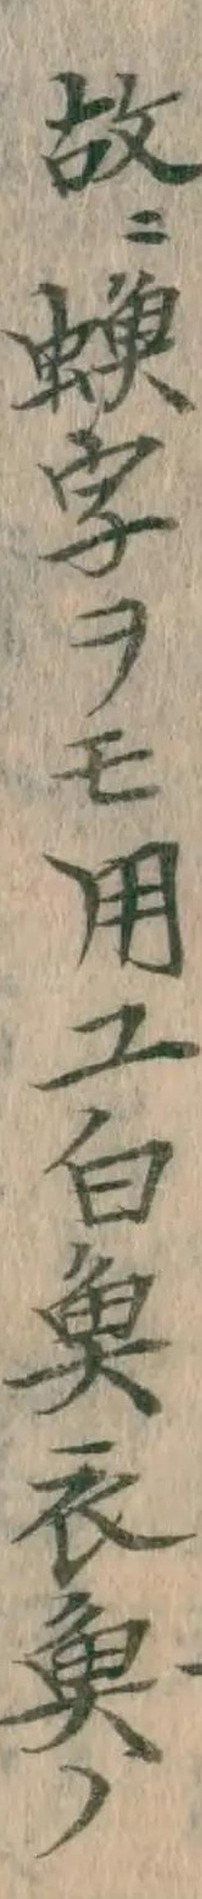故ニ字ヲモ用ユ白魚衣魚ノ
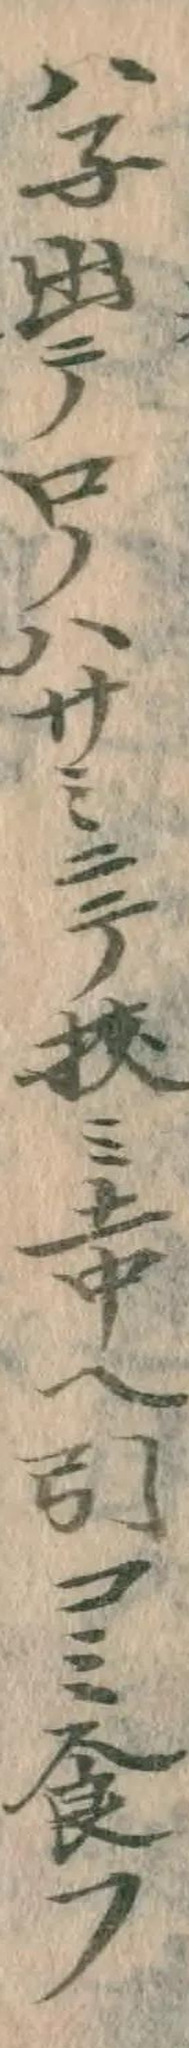ハネ出テ口ノハサミニテ挟ミ土中ヘ引コミ食フ
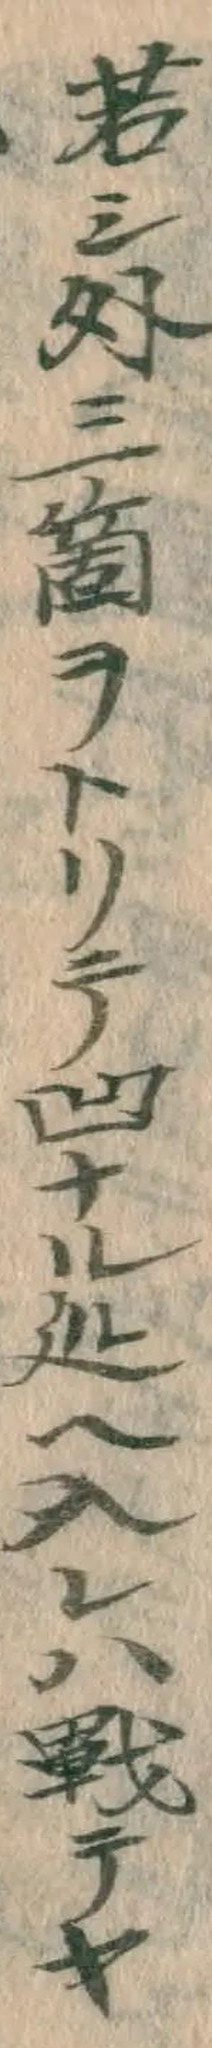若シ外三箇ヲトリテ凹ナル処ヘ入レハ戦テヤ
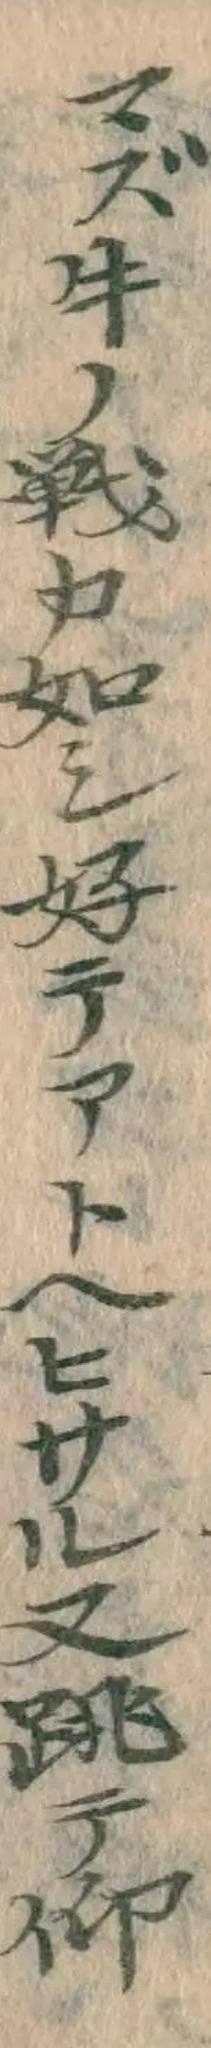マズ牛ノ戦カ如シ好テアトヘアトヘヒサル又跳テ仰
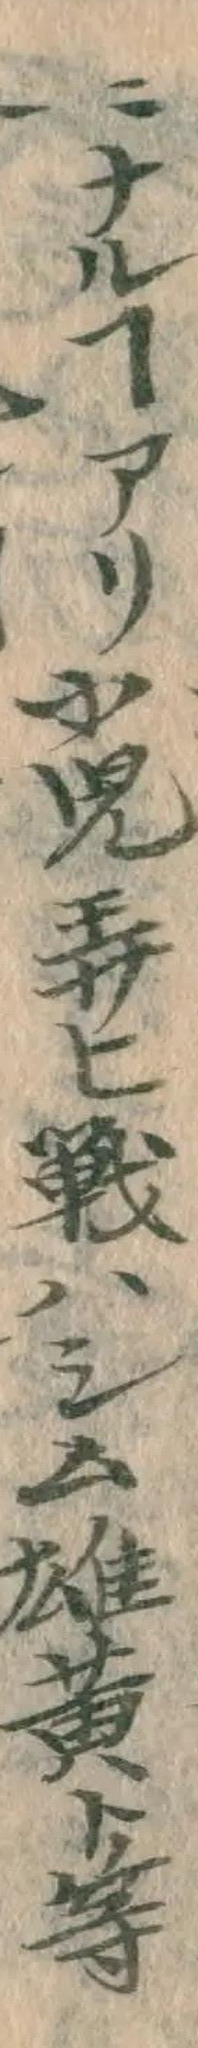ニナルコトアリ小児弄ヒ戦ハシム雄黄ト枔
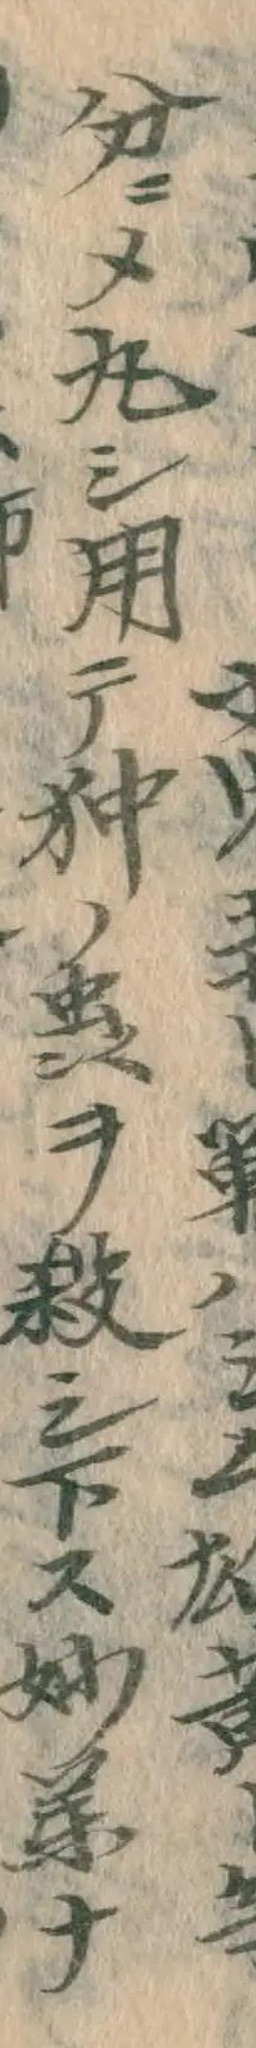分ニシテ丸シ用テ狆ノ蟲ヲ殺シ下ス妙枔ナ
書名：千蟲譜 3巻. [2]
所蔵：国立国会図書館 National Diet Library, JAPAN
